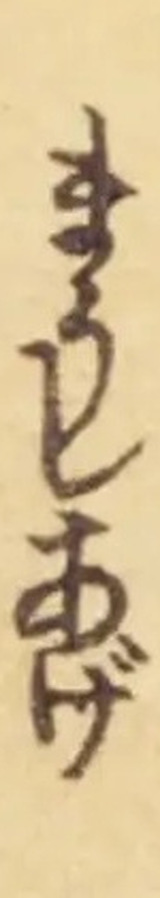まうしあげ
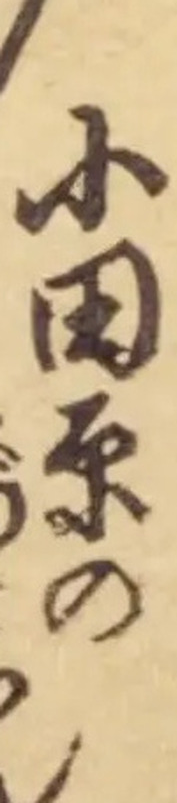小田原の
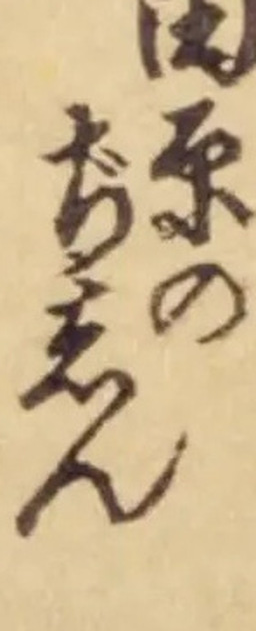ぢしん
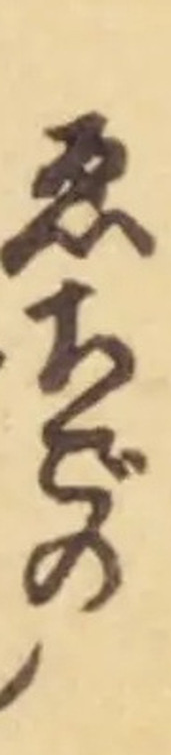ゑちごの
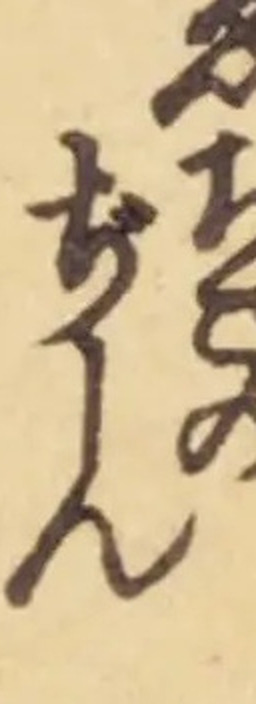ぢしん
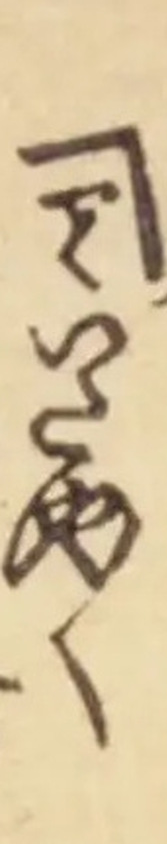「アヽいたや〳〵
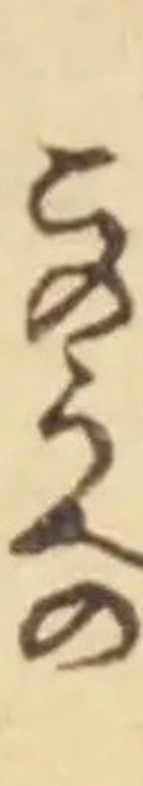このうへの
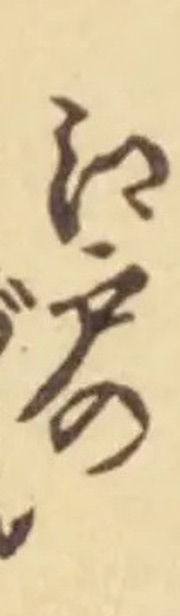江戸の
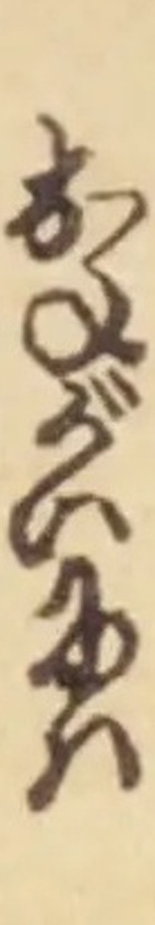おねがいには
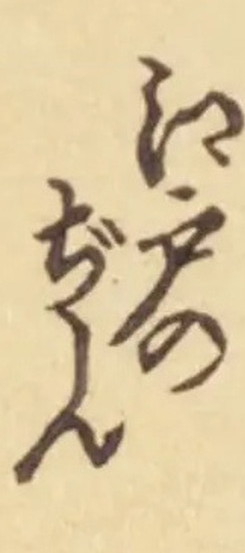ぢしん
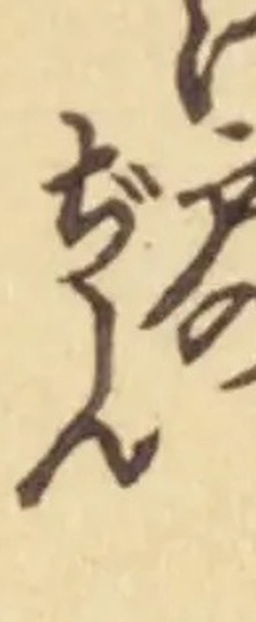ぢしん
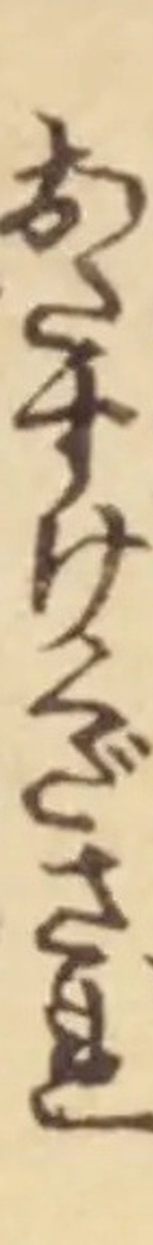おたすけくだされ
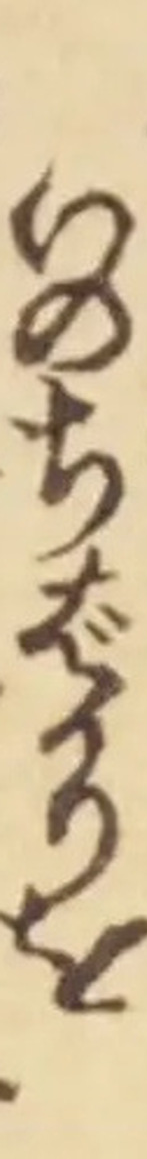いのちばかりを
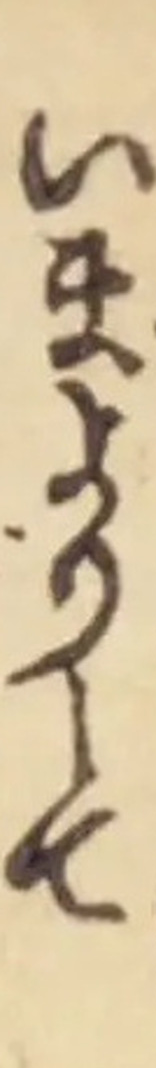いまよりして
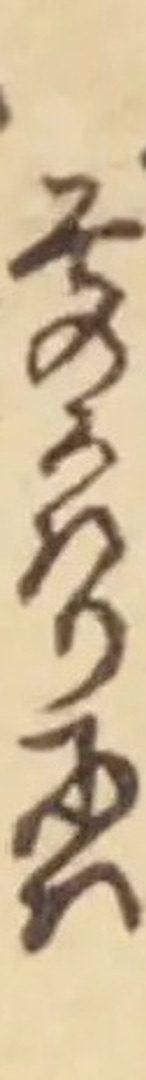そのかはりには
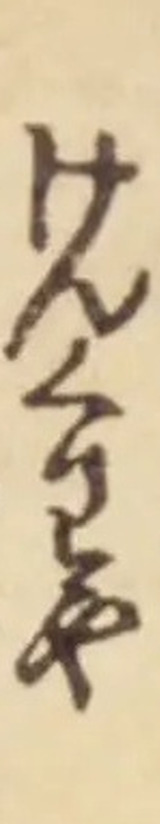けんくわや
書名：（地震鯰の取調べ）
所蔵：国立国会図書館 National Diet Library, JAPAN
